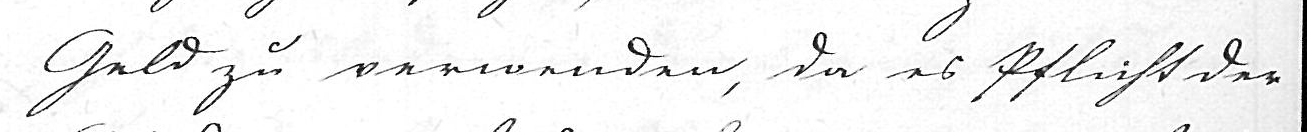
Geld zu verwenden, da es Pflicht der
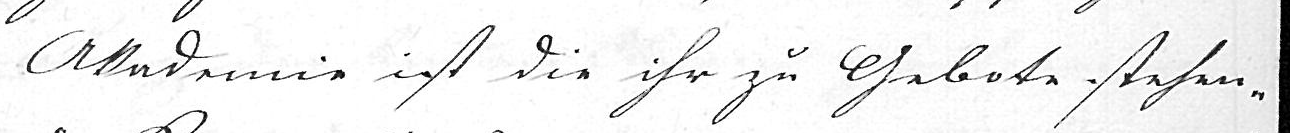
Akademie ist die ihr zu Gebote stehen-
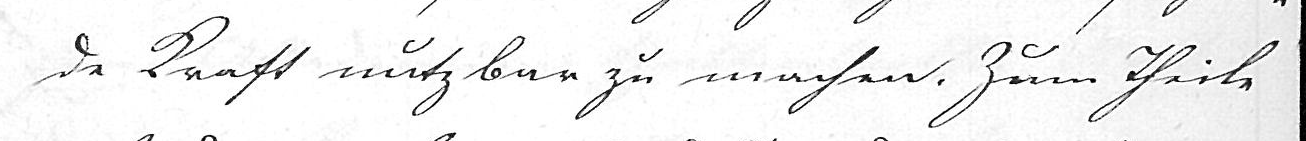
de Kraft nutzbar zu machen. Zum Theile
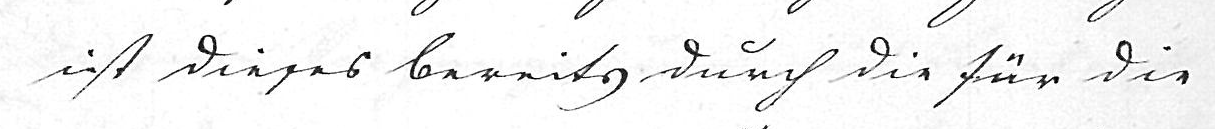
ist dieses bereits durch die für die
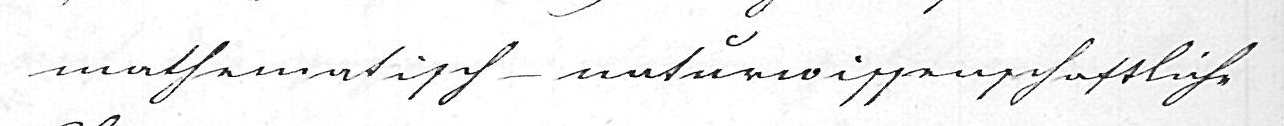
mathematisch-naturwissenschaftliche
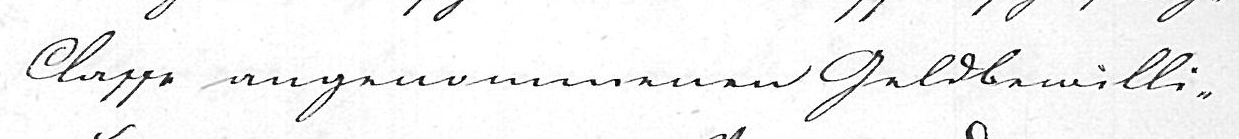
Classe angenommenen Geldbewilli-
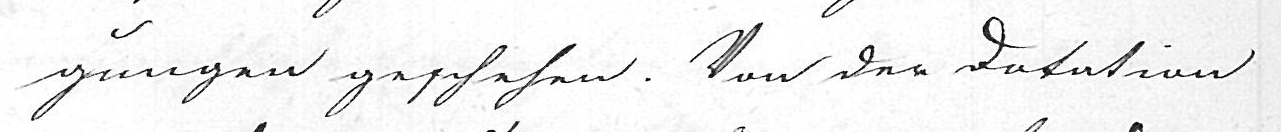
gungen geschehen. Von der Dotation
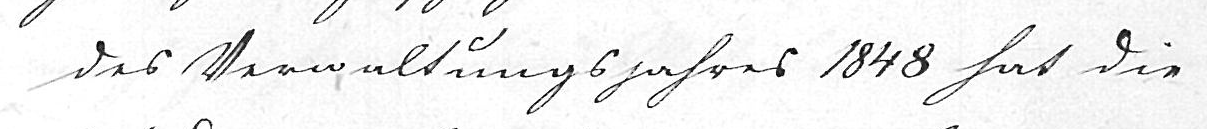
des Verwaltungsjahres 148 hat die
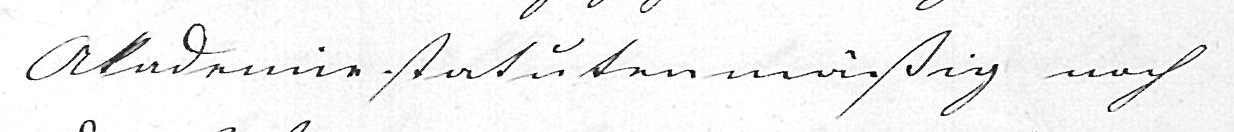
Akademie statutenmäßig noch
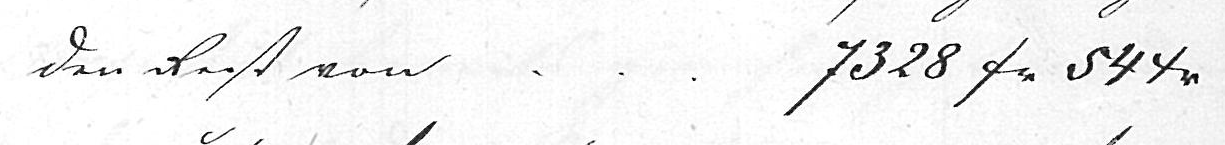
den Rest von 7328 fr 54 kr
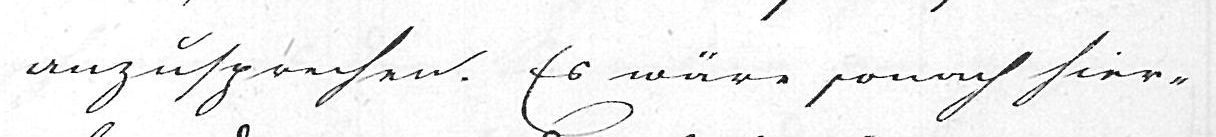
anzusprechen. Es wäre sonach hier-
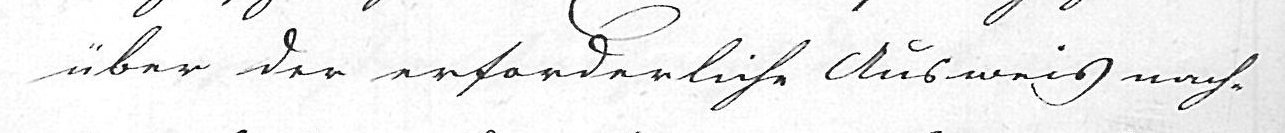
über der erforderliche Ausweis nach-
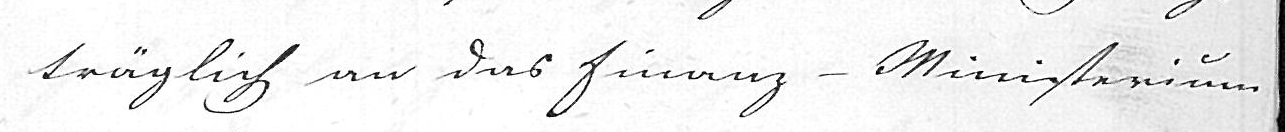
träglich an das Finanz-Ministerium
